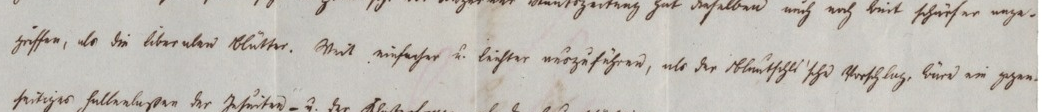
griffen, als die liberalen Blätter. Weit einfacher u. leichter auszuführen, als der Bluntschli'sche Vorschlag, wäre ein gegen-
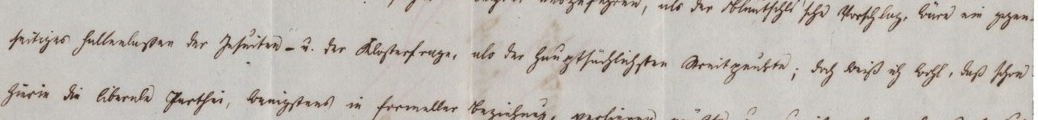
seitiges Fallenlassen der Jesuiten- u. der Klosterfrage, als der hauptsächlichsten Streitpunkte; doch weiß ich wohl, daß schon
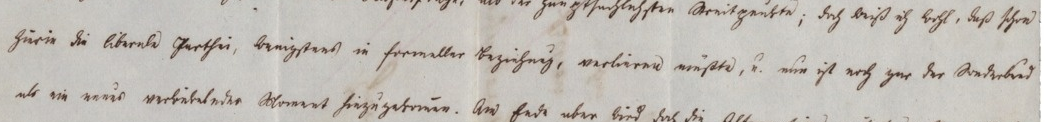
hierin die liberale Parthei, wenigstens in formeller Beziehung, verlieren müßte, u. nun ist noch gar der Sonderbund
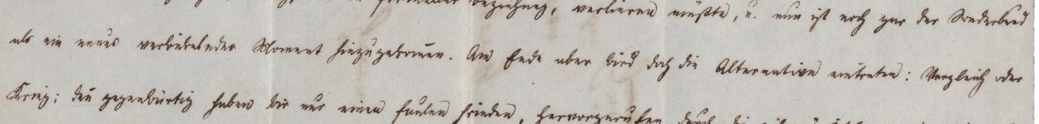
als ein neues verwickelndes Moment hinzugekommen. Am Ende aber wird doch die Alternative eintreten: Vergleich oder
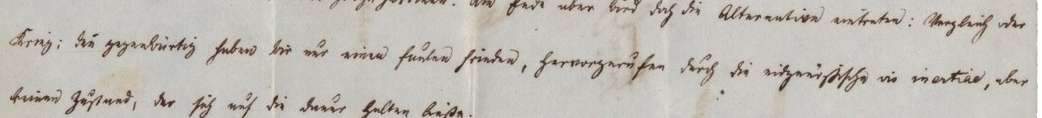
Krieg; denn gegenwärtig haben wir nur einen faulen Frieden, hervorgerufen durch die eigenössische vis inertiae, aber
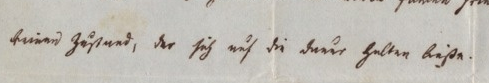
keinen Zustand, der sich auf die Dauer halten ließe.
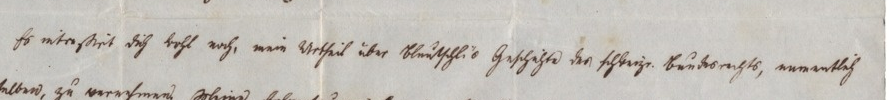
Es intressirt dich wohl noch, mein Urtheil über Bluntschli's Geschichte des schweizr. Bundesrechts, namentlich
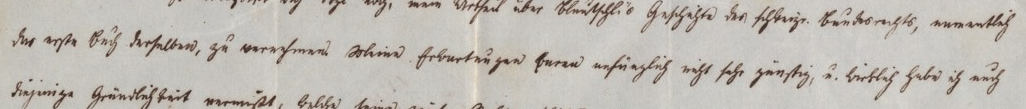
das erste Buch derselben, zu vernehmen. Meine Erwartungen waren anfänglich nicht sehr günstig, u. wirklich habe ich auch
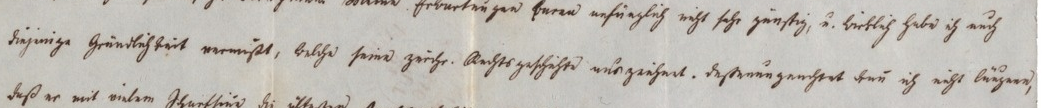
diejenige Gründlichkeit vermißt, welche seine zürchr. Rechtsgeschichte auszeichnet. Dessenungeachtet kann ich nicht läugnen,
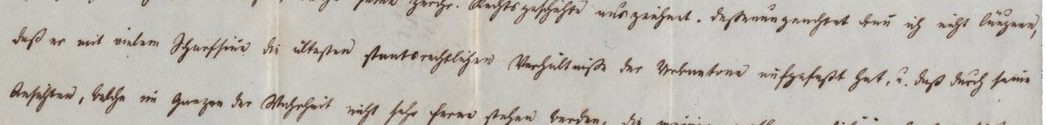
daß er mit vielem Scharfsinne die ältesten staatsrechtlichen Verhältnisse der Urkantone aufgefaßt hat, u. daß durch seine
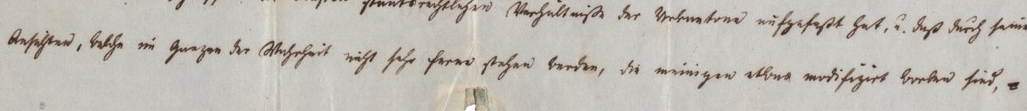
Ansichten, welche im Ganzen der Wahrheit nicht sehr ferne stehen werden, die meinigen etwas modifizirt worden sind,
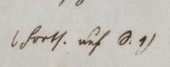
(Forts. auf S. 1)
